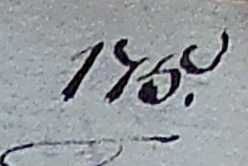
175.
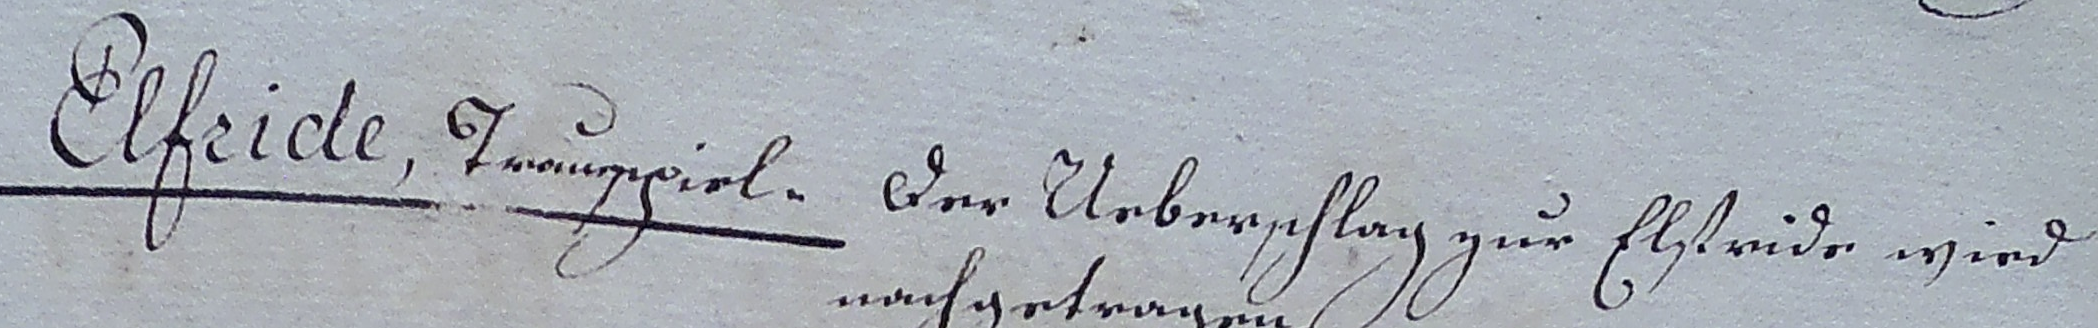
Elfride, Trauerspiel. Der Ueberschlag zur Efride wird
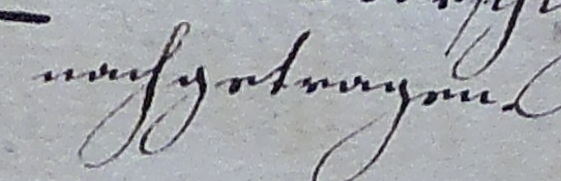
nachgetragen.
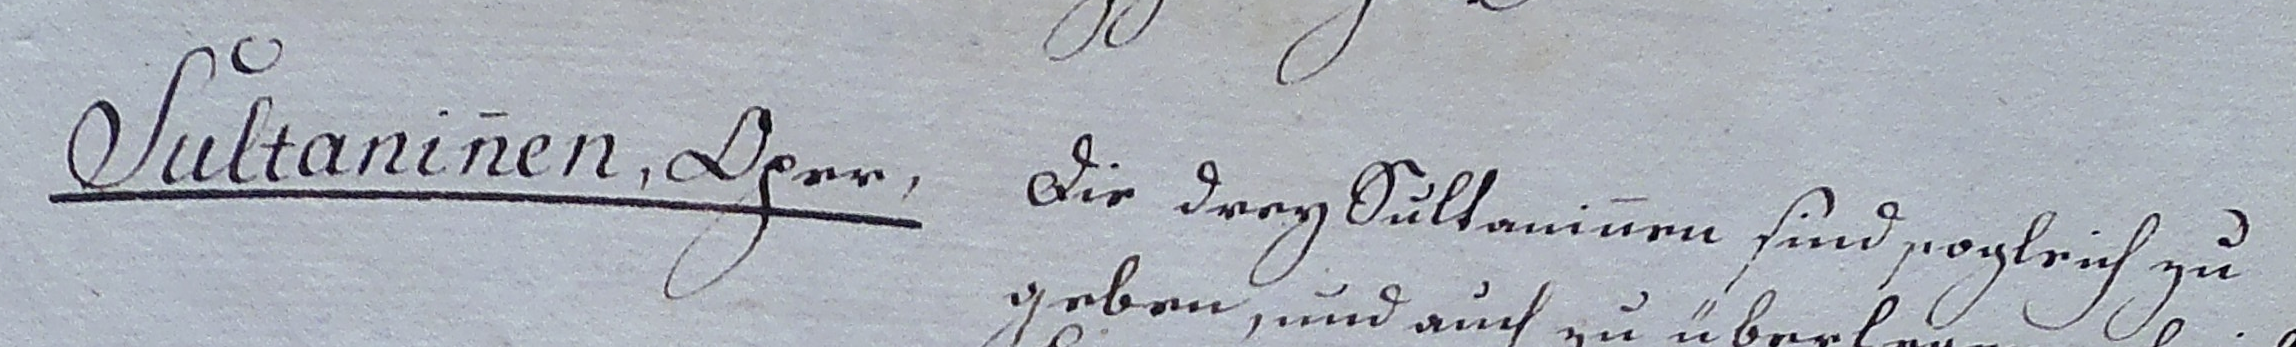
Sultanin̅en, Oper. Die drey Sultanin̅en sind sogleich zu
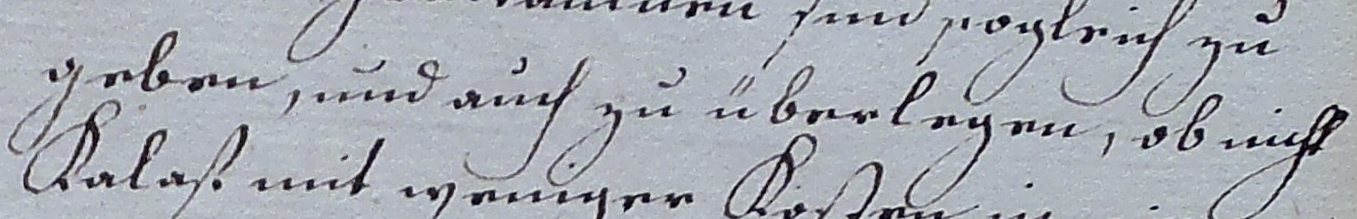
geben, und auch zu überlegen, ob nicht
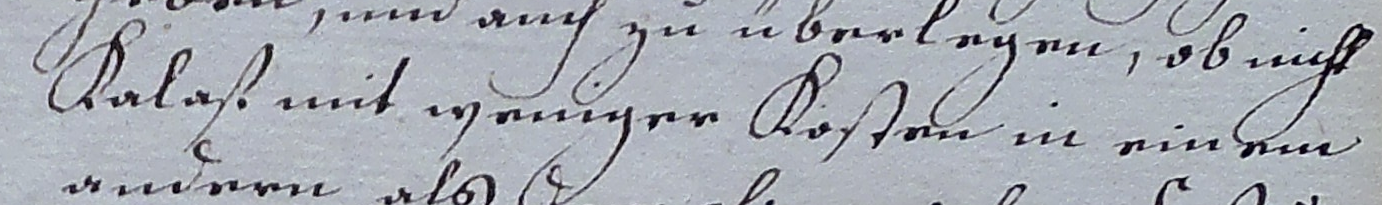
Kalaf mit wenigen Kosten in einem
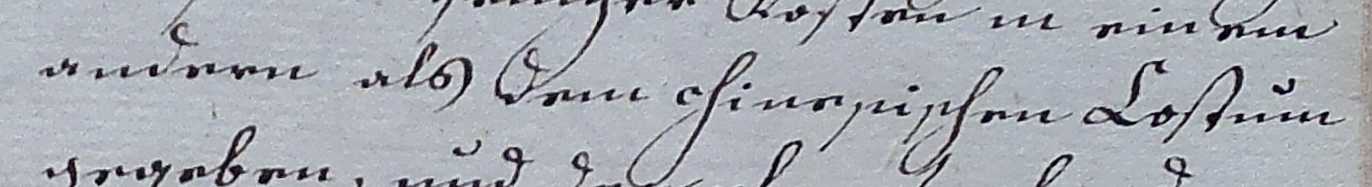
andern als dem chisesischen Costum
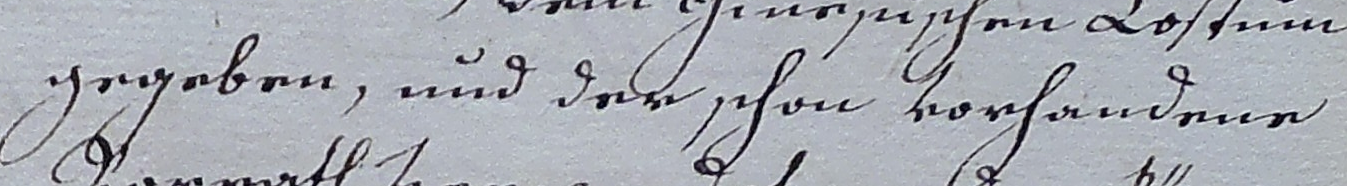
gegeben, und der schon vorhandene
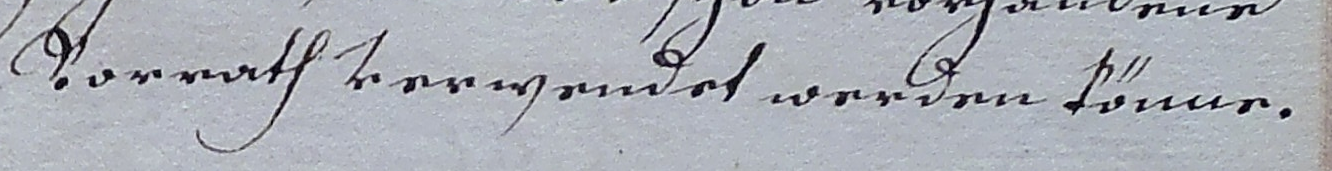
Vorrath verwendet werden könne.
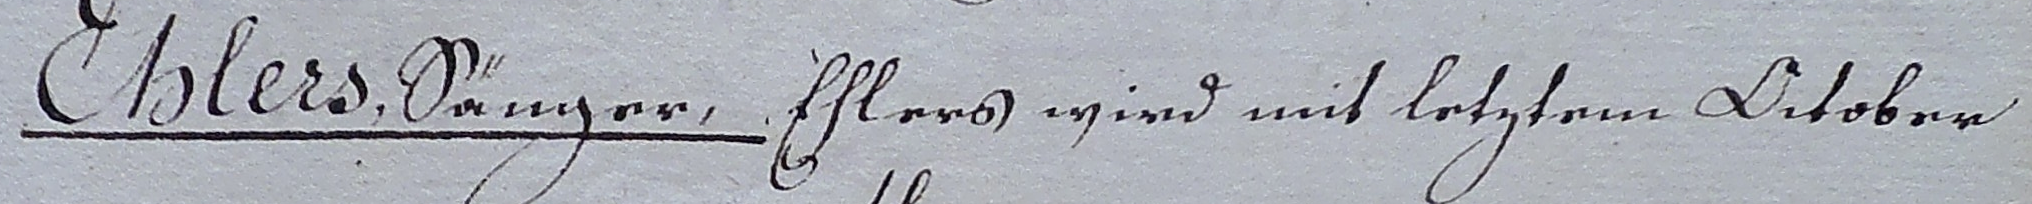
Ehlers, Sänger. Ehlers wird mit letzten October
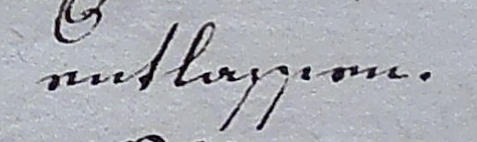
entlassen.
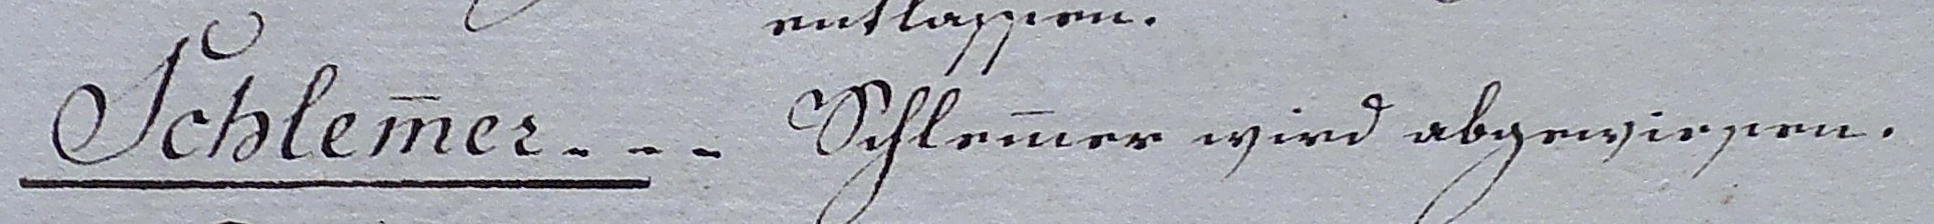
Schlem̅er .. .. .. Schlem̅er wird abgewiesen.
